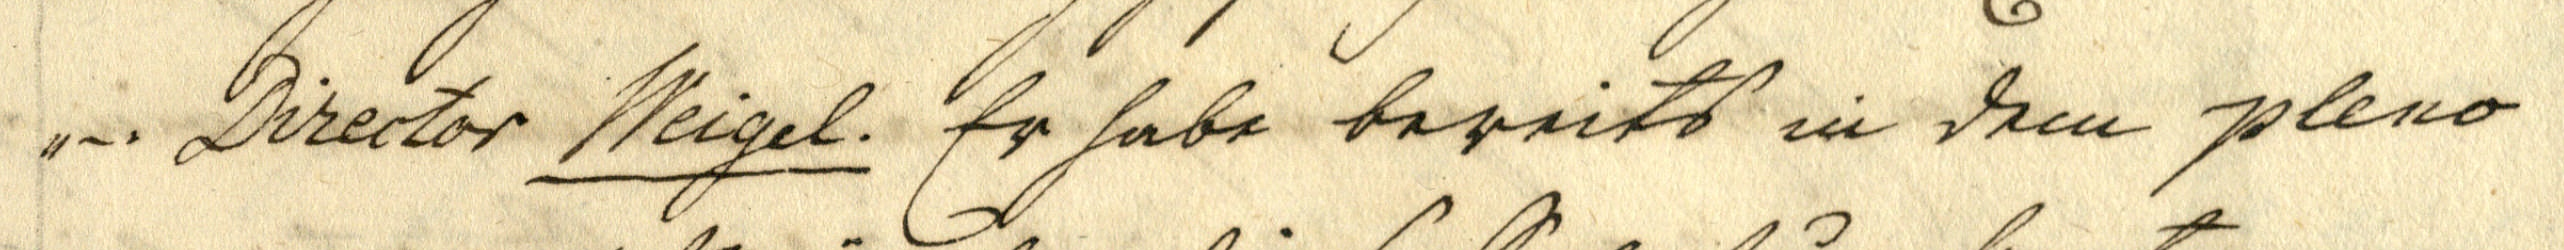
" - " Director Weigel. Er habe bereits in dem pleno
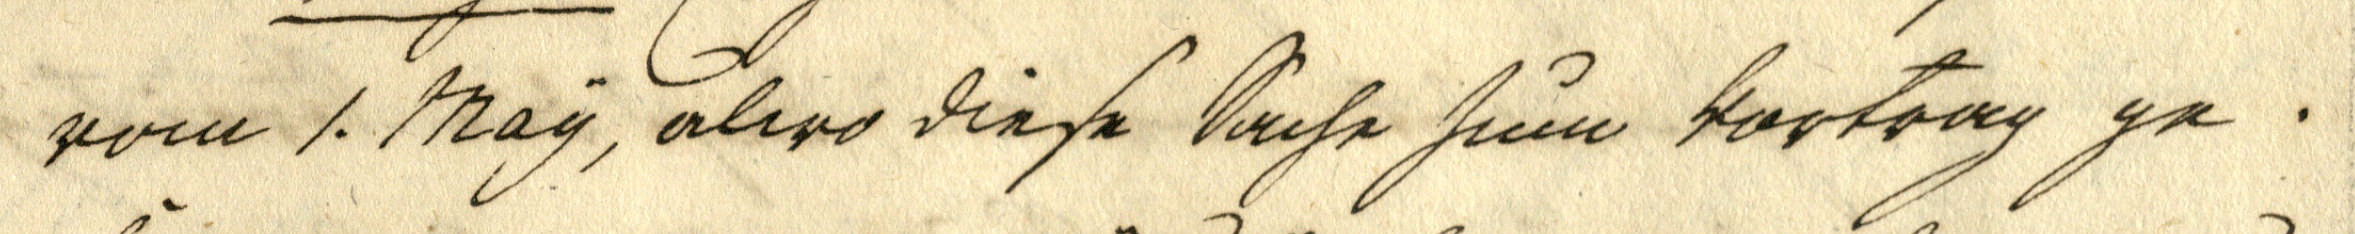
vom 1. May, alwo diese Sache zum Vortrag ge-
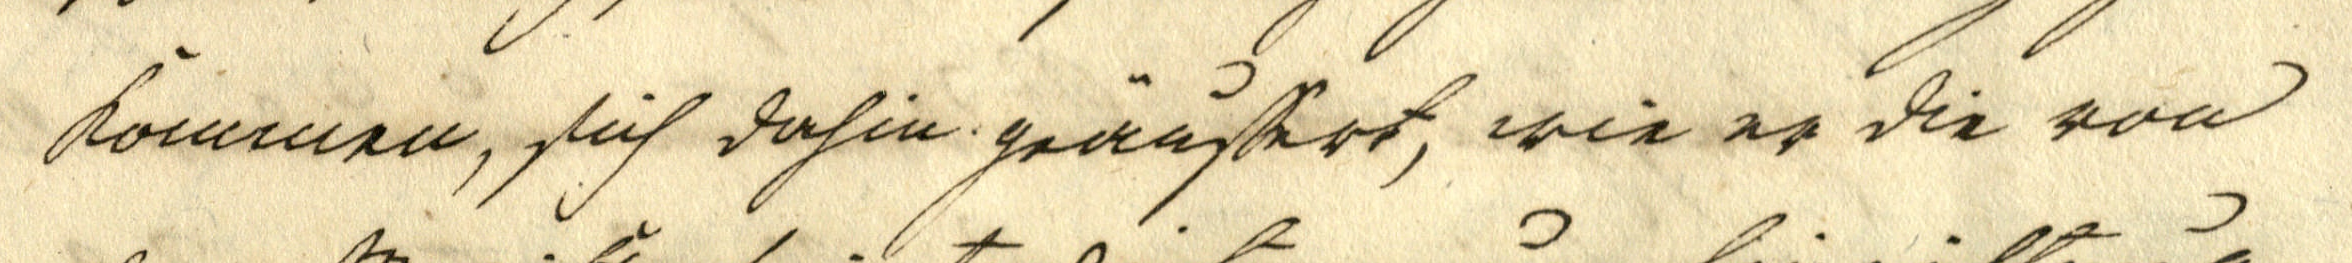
kommen, sich dahin geäussert, wie er die von
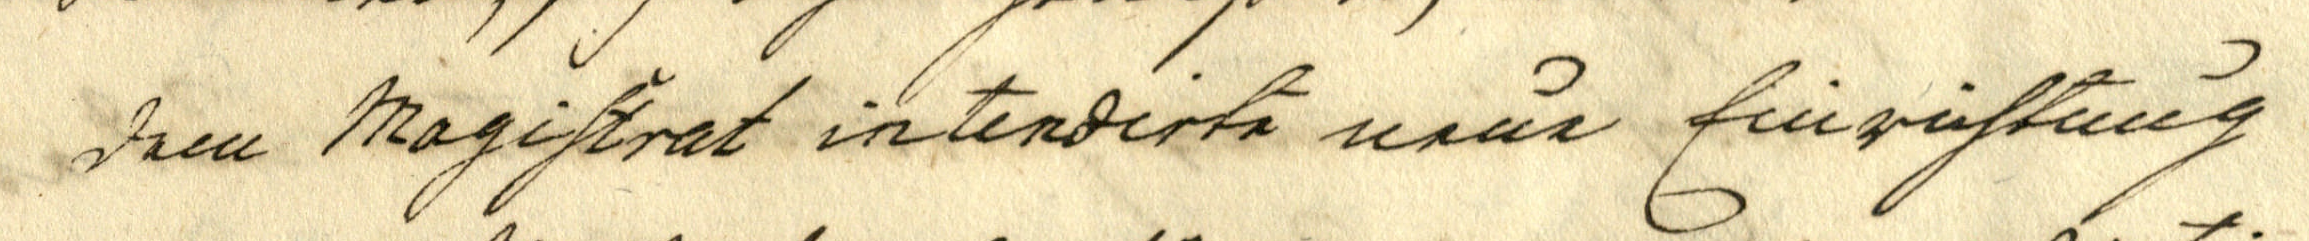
dem Magistrat intendirte neue Einrichtung
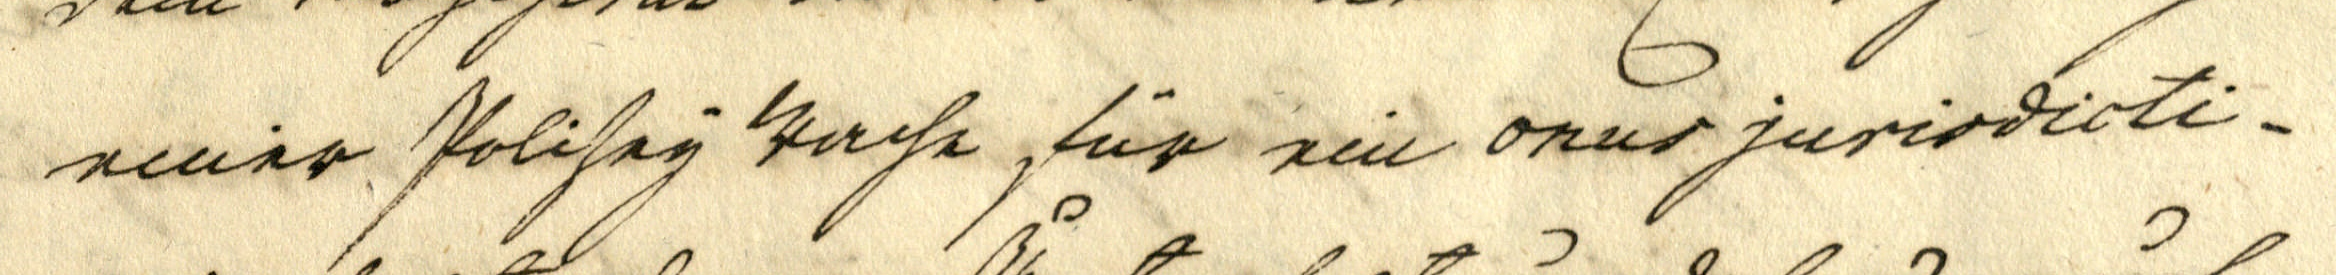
einer Polizey Wache für ein onus jurisdicti-
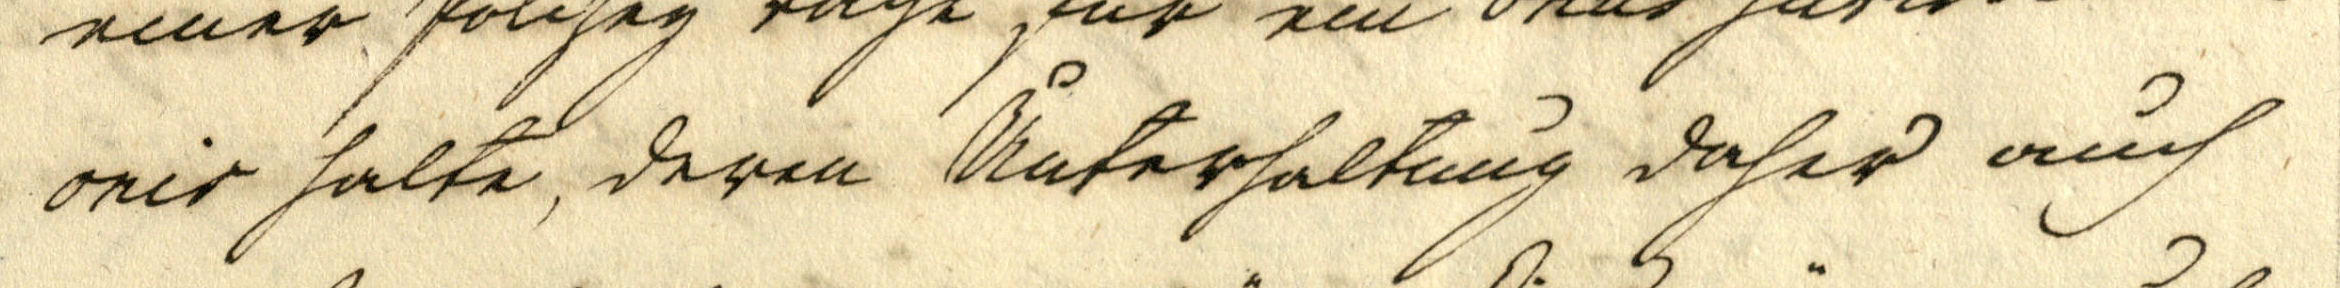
onis halte, deren Unterhaltung daher auch
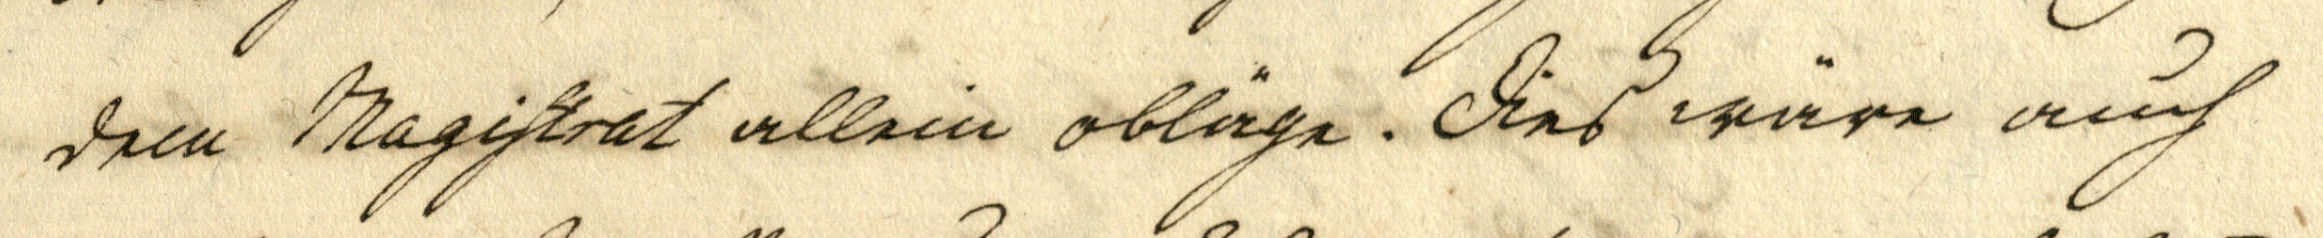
dem Magistrat allein obläge. Dies wäre auch
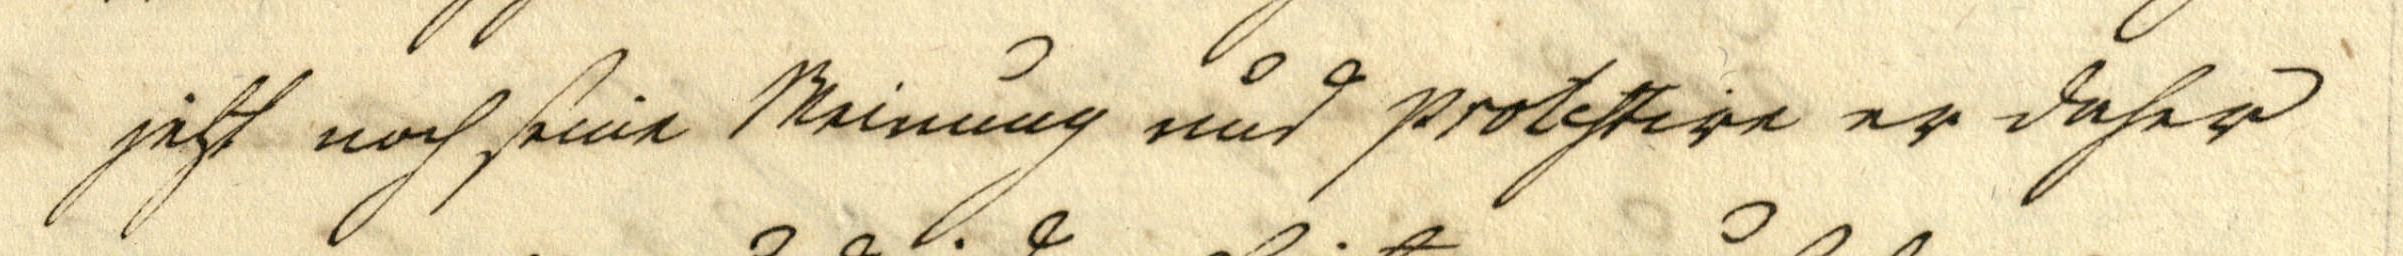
jetzt noch seine Meinung und protestire er daher
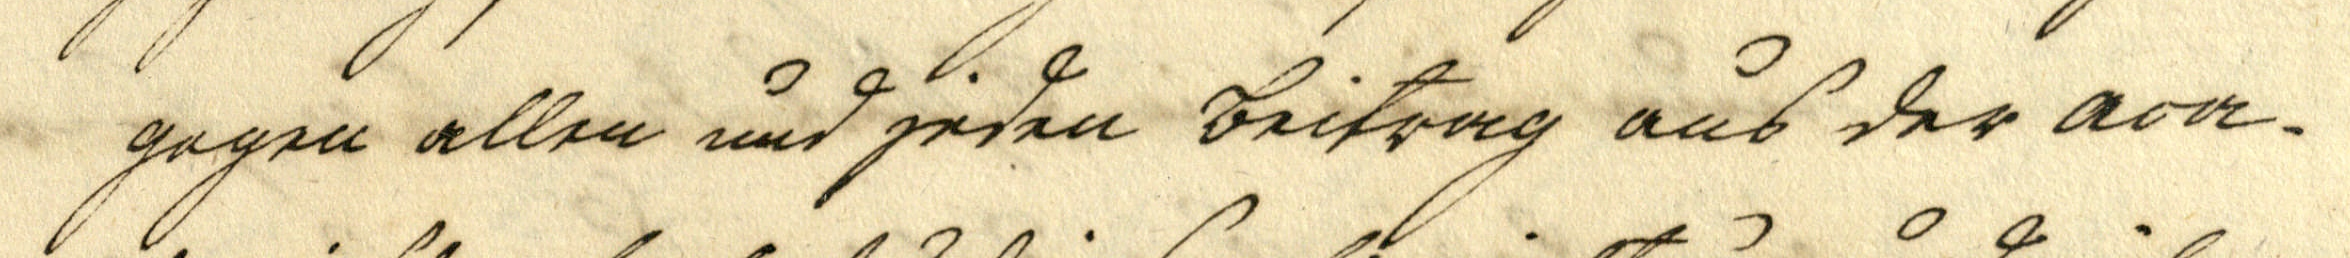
gegen allen und jeden Beitrag aus der aca-
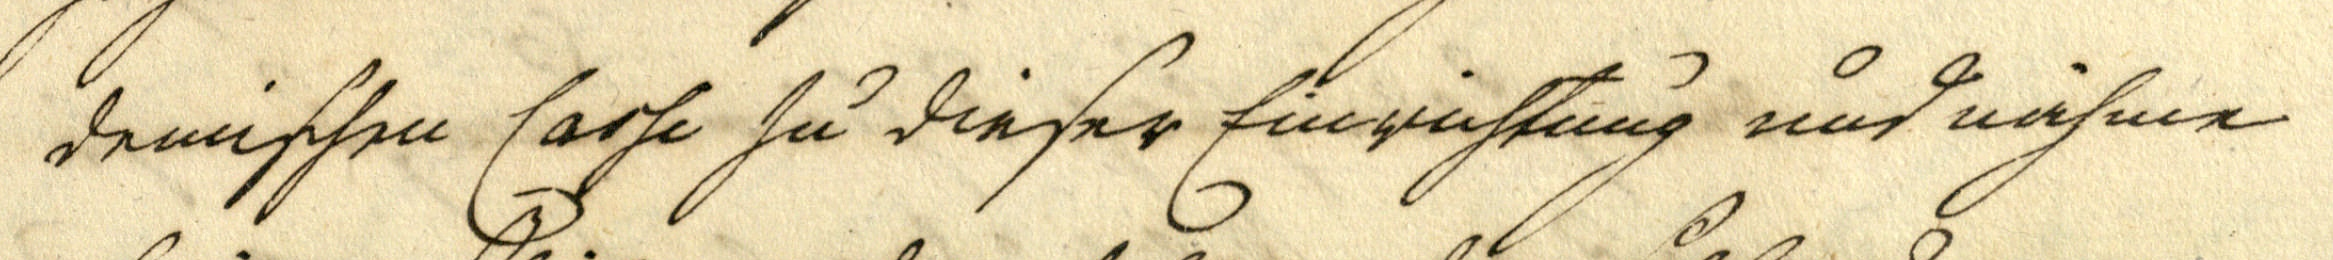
demischen Casse zu dieser Einrichtung und nähme
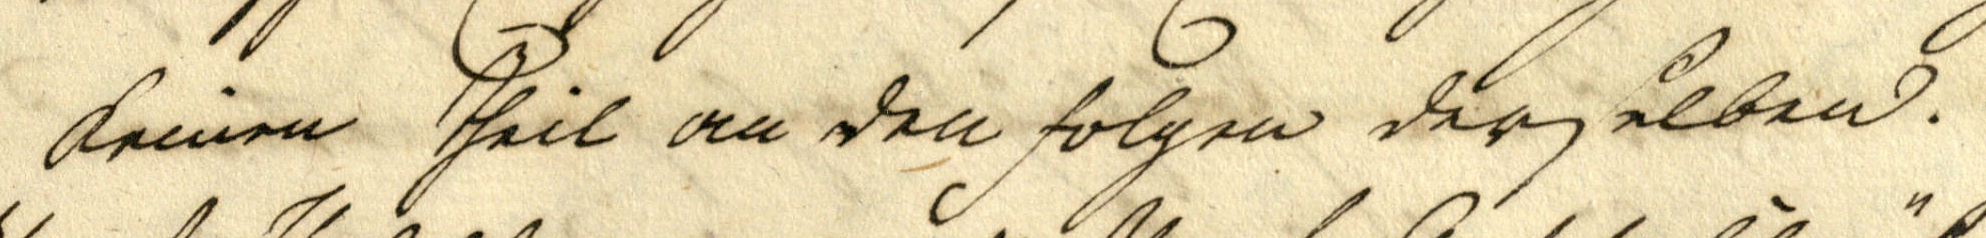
keinen Theil an den Folgen derselben.
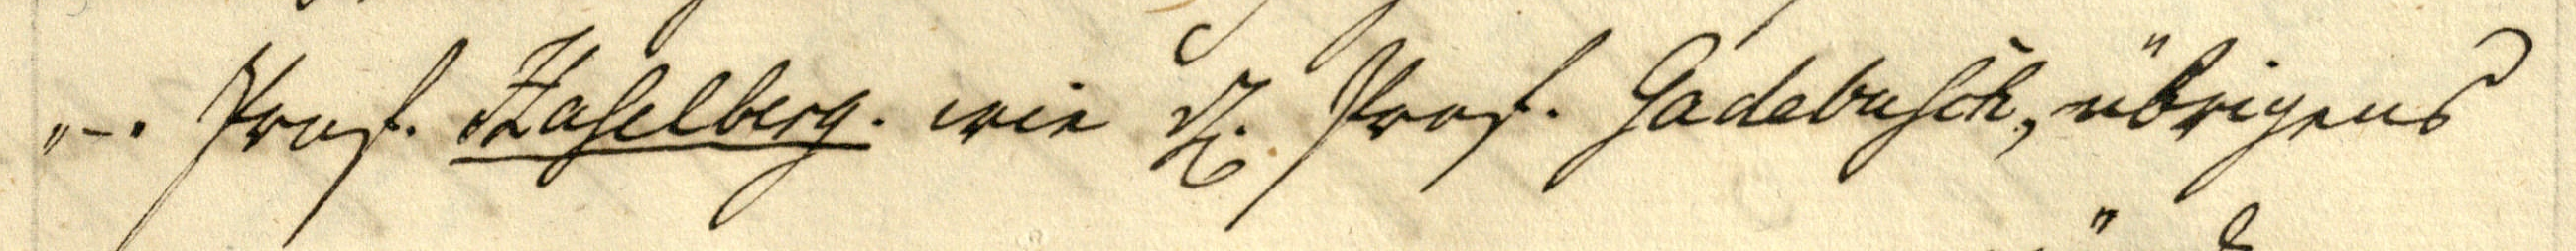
" - " Prof. Haselberg. wie dh. Prof. Gadebusch, übrigens
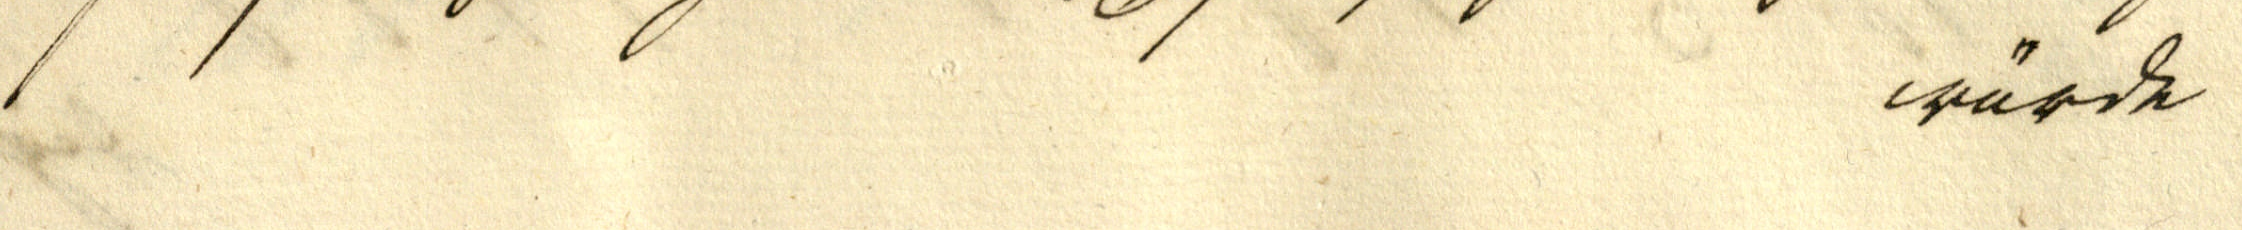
würde
